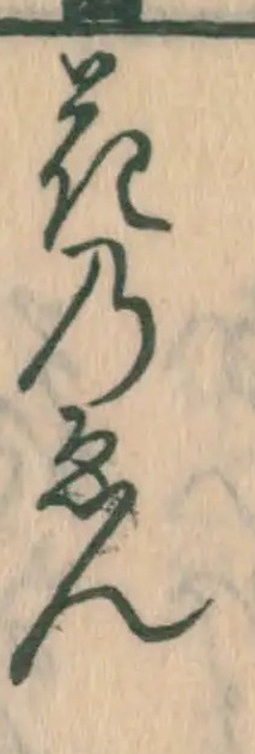花のゑん
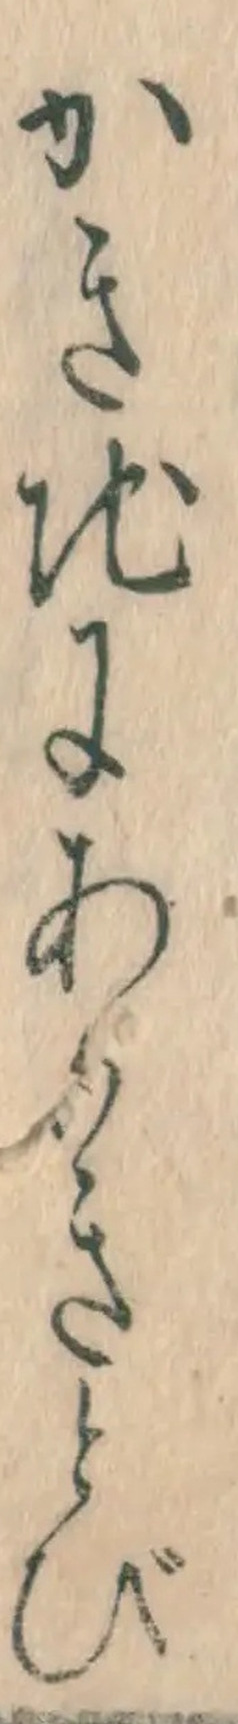かき地にあかきとび
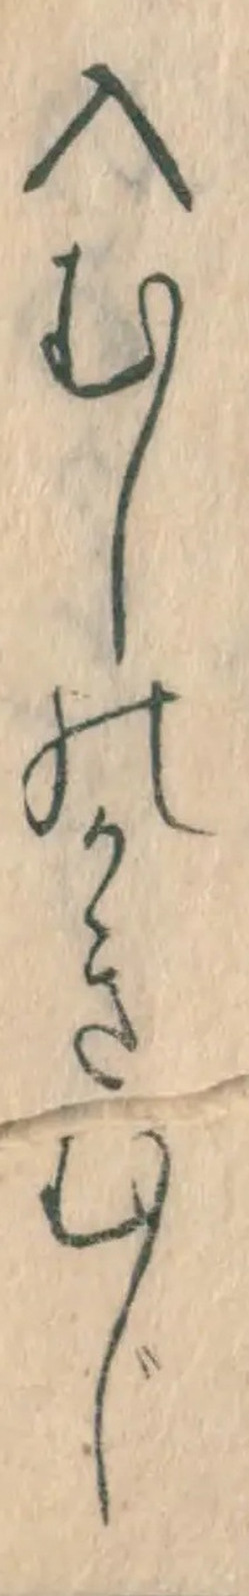入むしのかきむじ

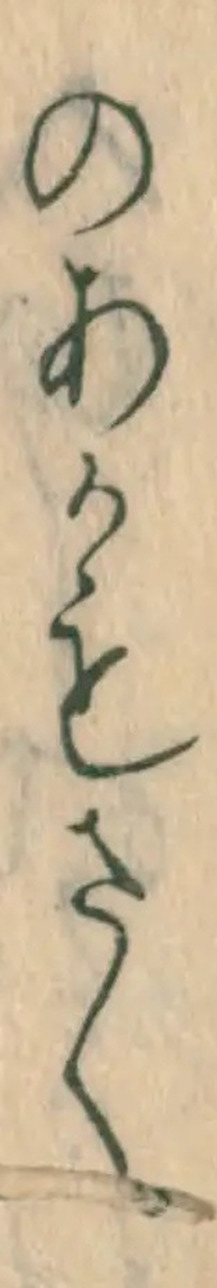のあかもさく
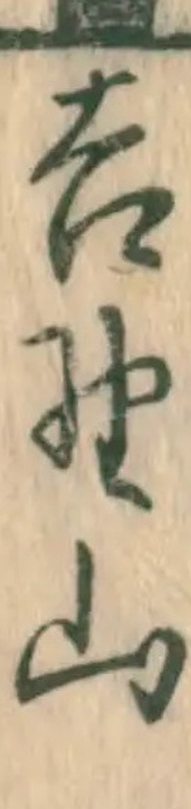吉野山
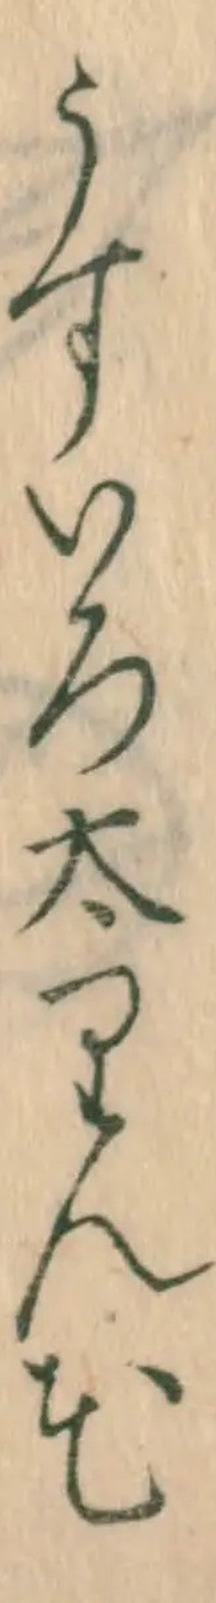うすいろ太りん花
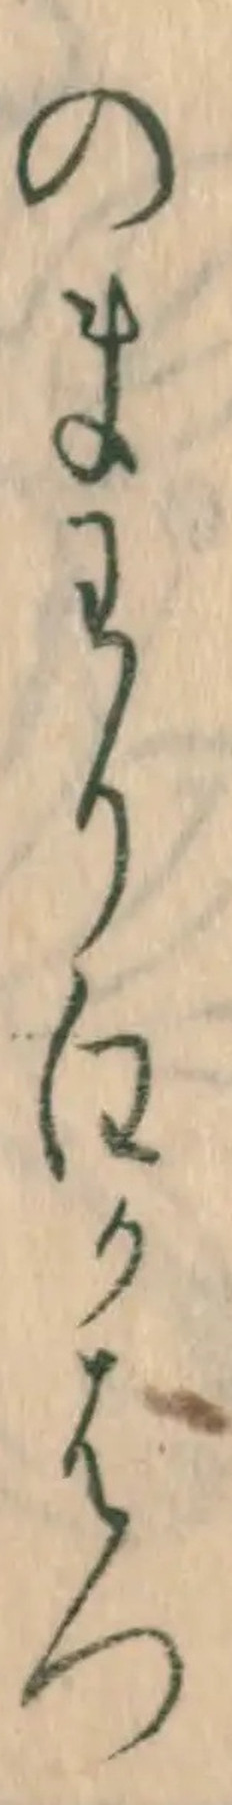のまわり白くはつ
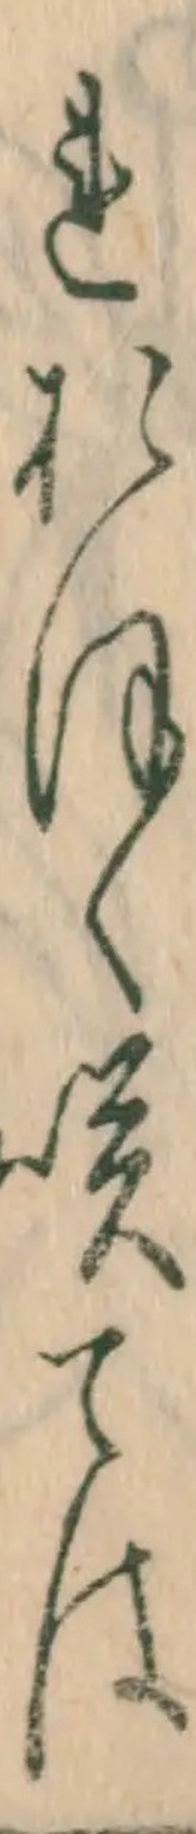れおほく咲ては
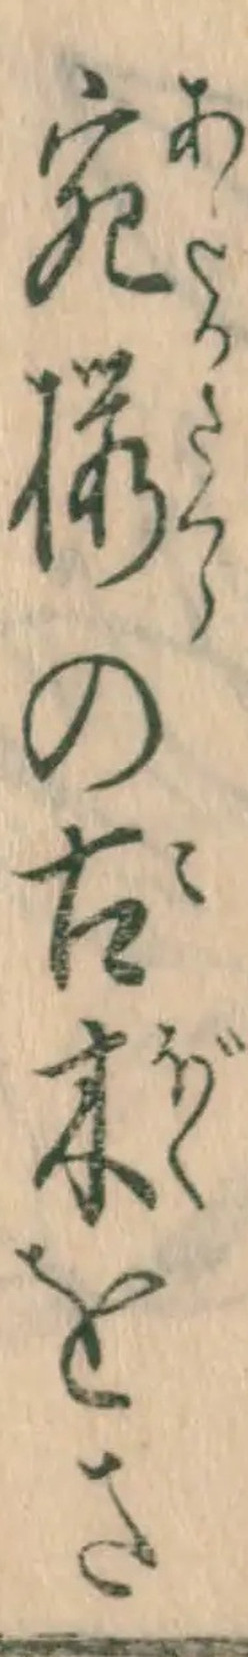宛桜の古木をさ
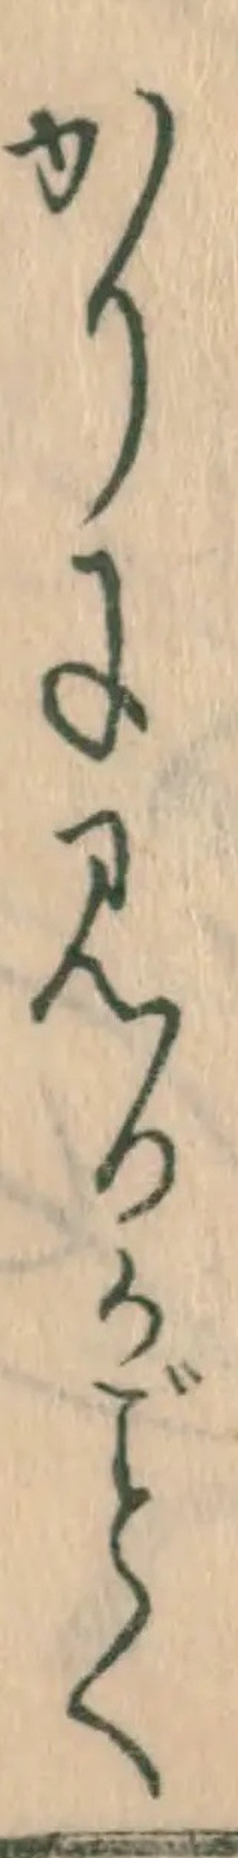かりに見るかごとく
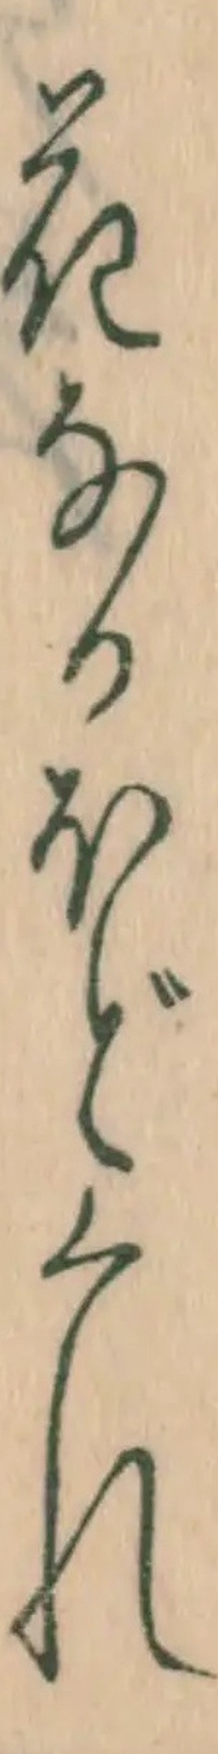花なるほどくれ
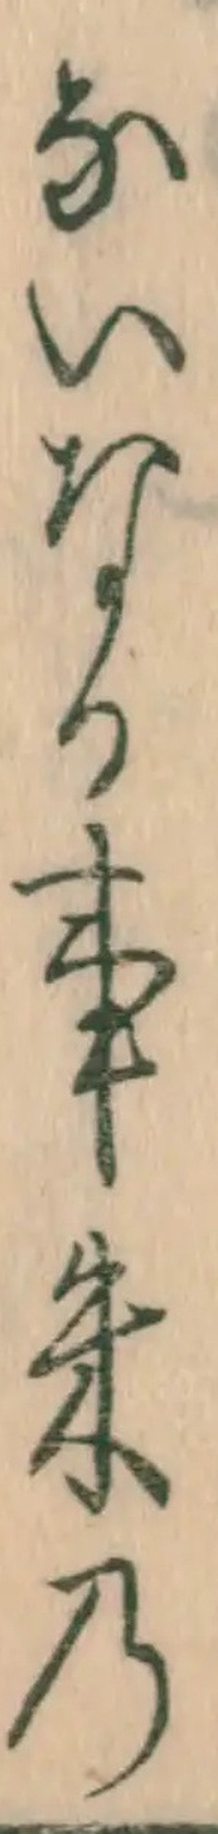ないなる事朱の
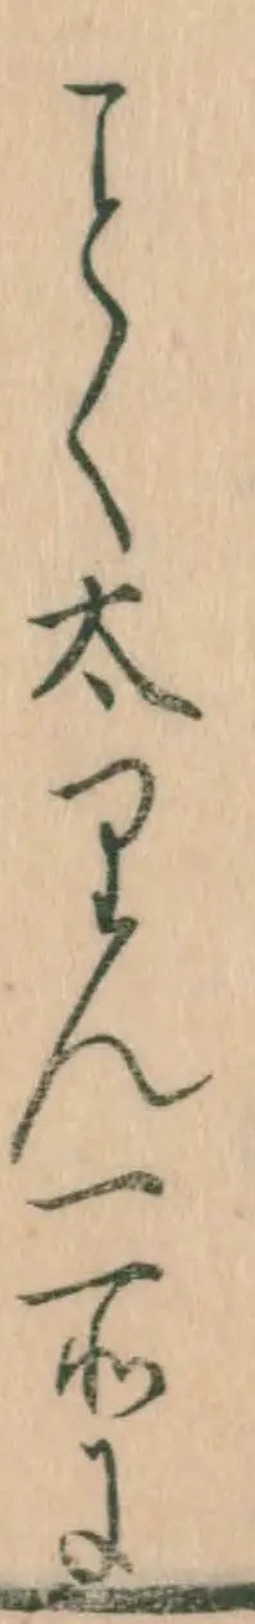ことく太りん一所に
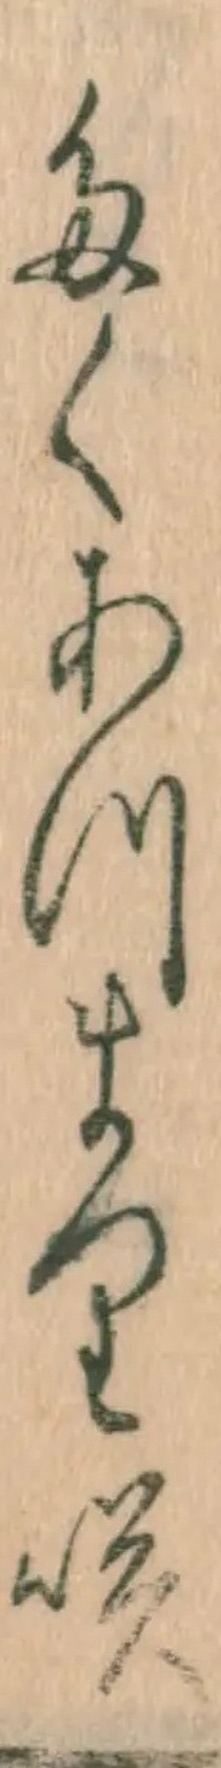多くあつまり咲
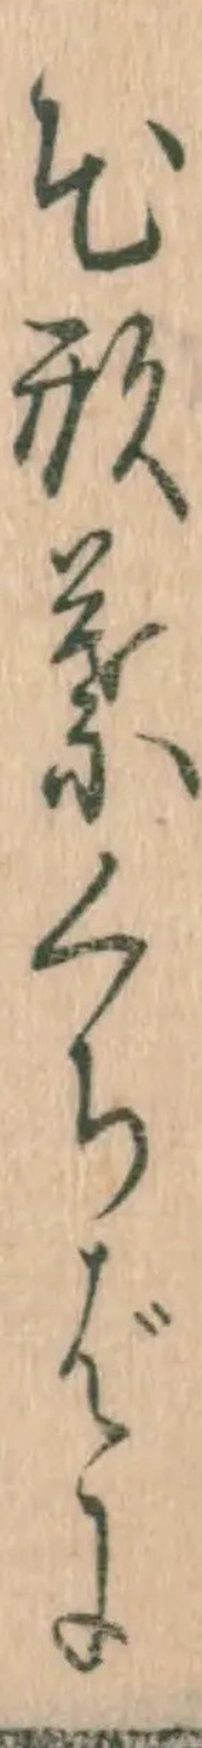花形葉くちばに
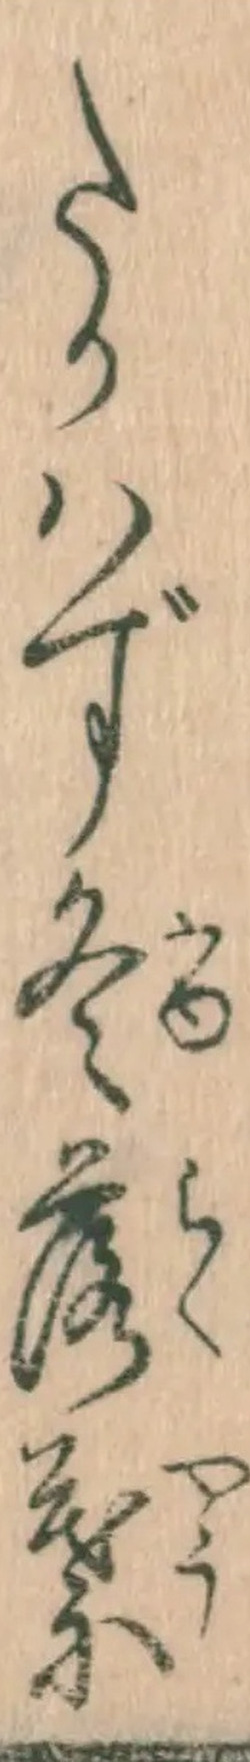たかはず冬落葉
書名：錦繍枕 5巻. [3]
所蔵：国立国会図書館 National Diet Library, JAPAN
